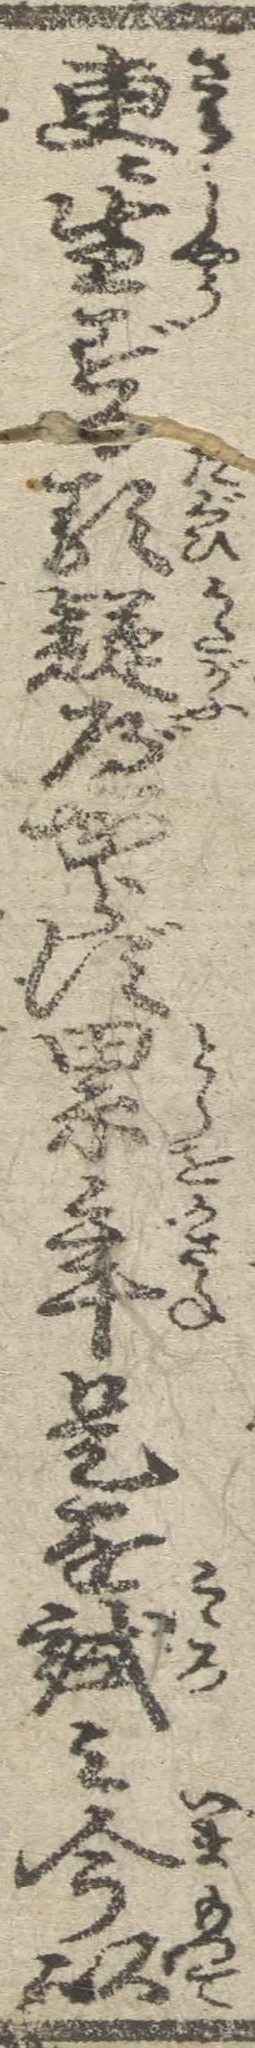更生ずる類疑べからず累年是を試み今以
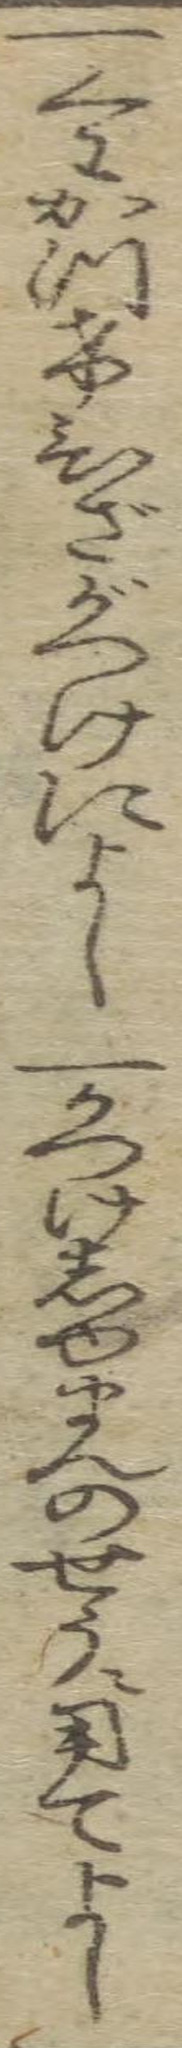一くにかつけひざがつけによし一かつけしゆまんのせう用てよし
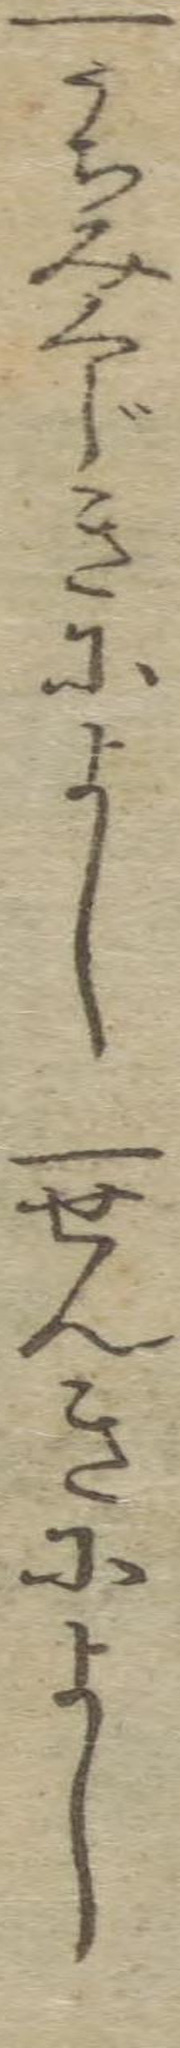一うちみくじきによし一せんきによし
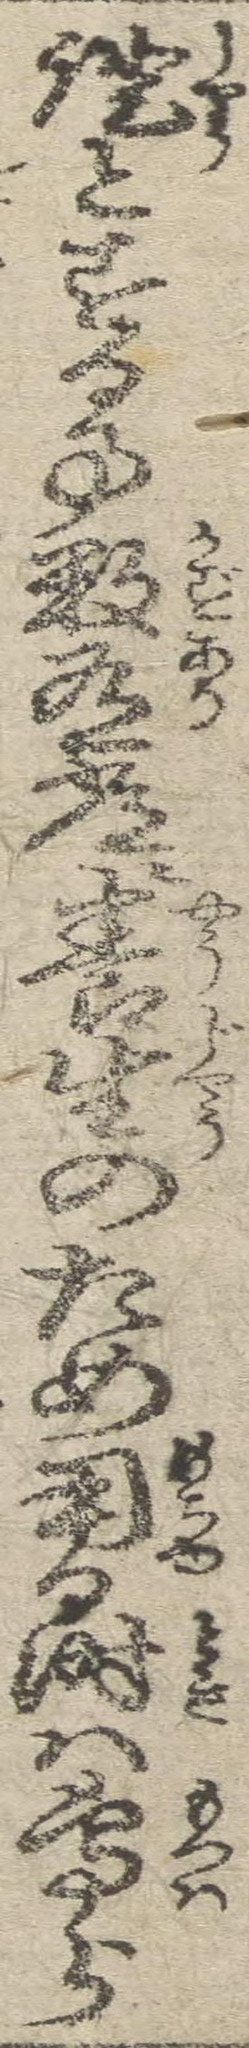證とする事数有常養生のため用る時は専ら
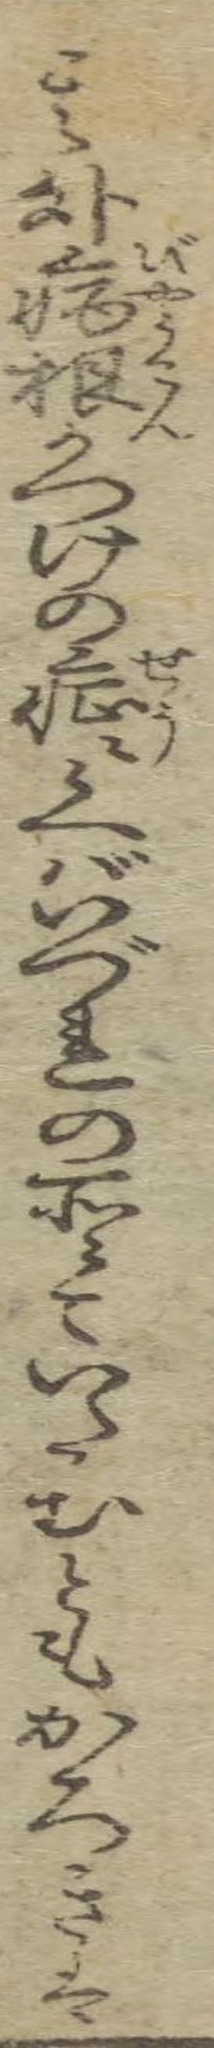其外病根かつけの症候へばいづれの所
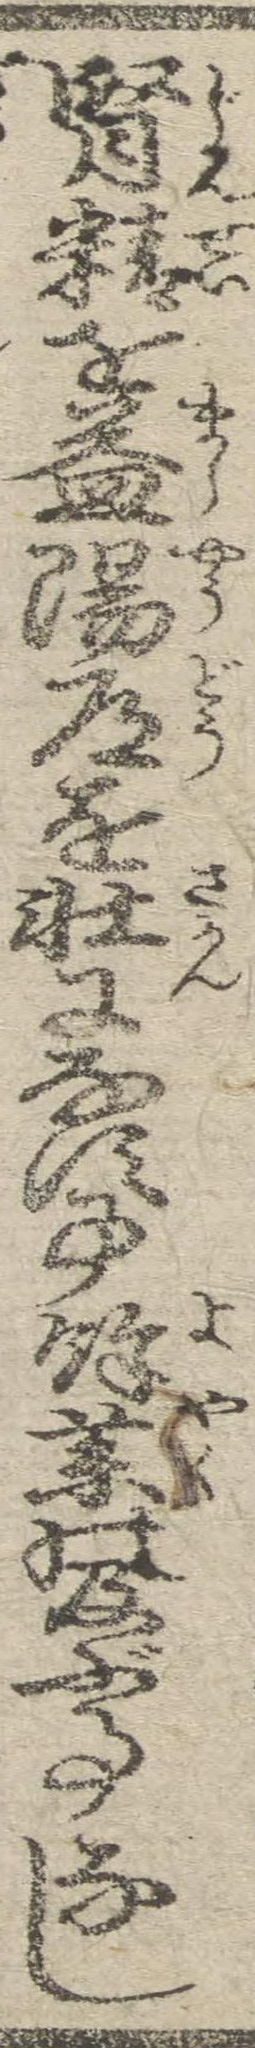腎精を益陽道を壮になす事余薬の及ぶ事なし
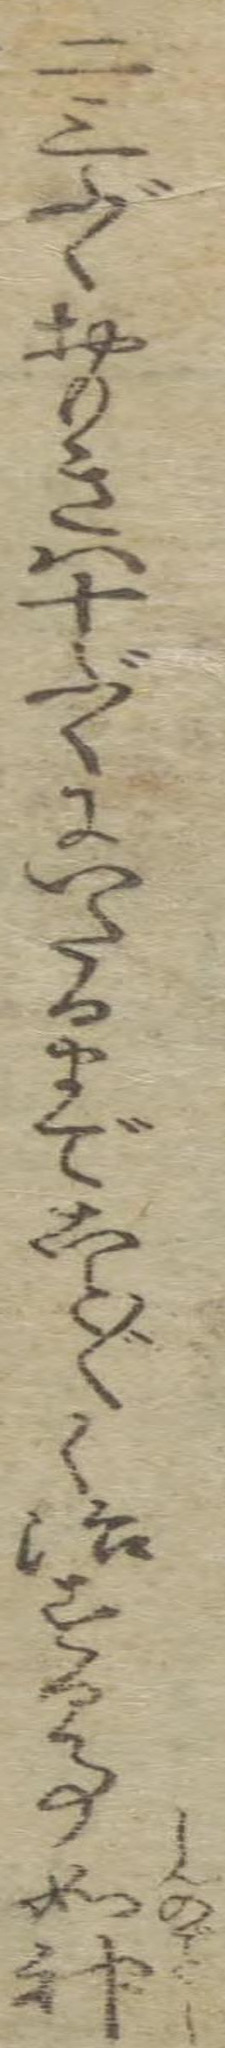二三ぶくおもきは十ぶくにいたるまでこと〴〵く治する事如神
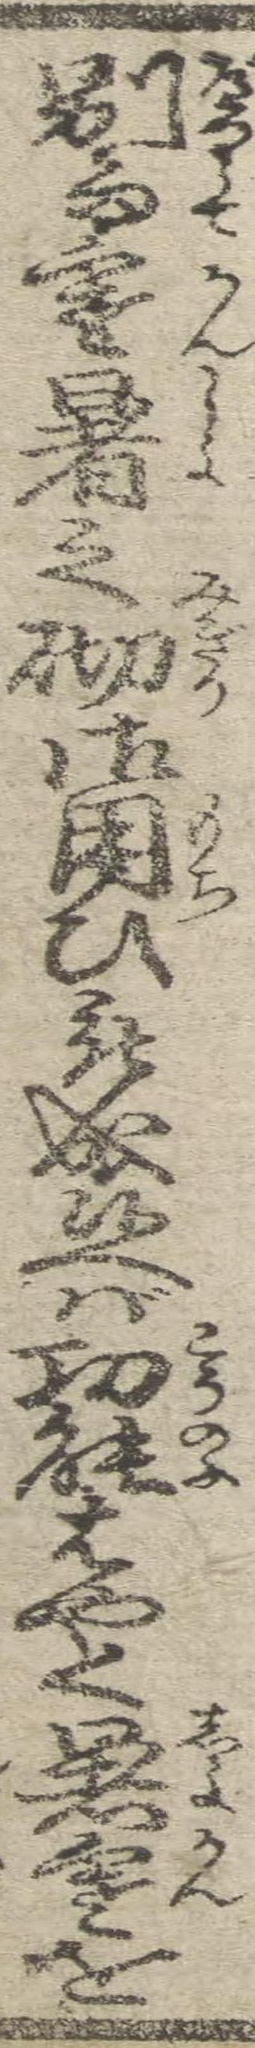別而寒暑の砌御用ひ被成候へば候功能はやく暑寒を
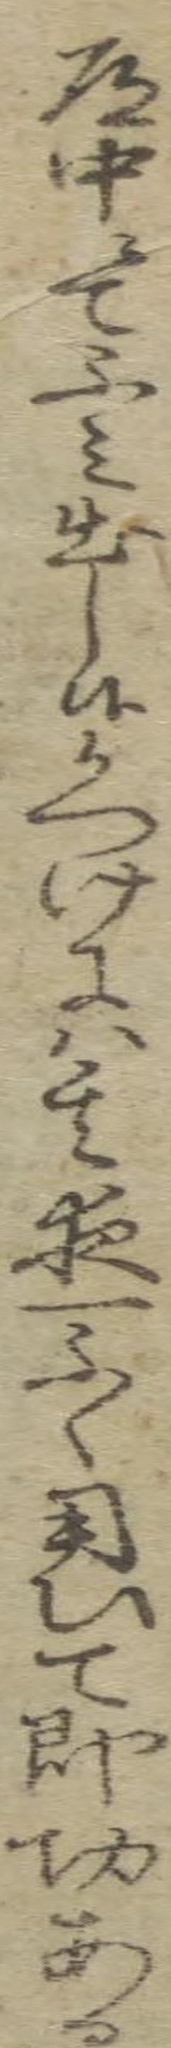道中出し候かつけには其夜一ふく用ひて即功ある
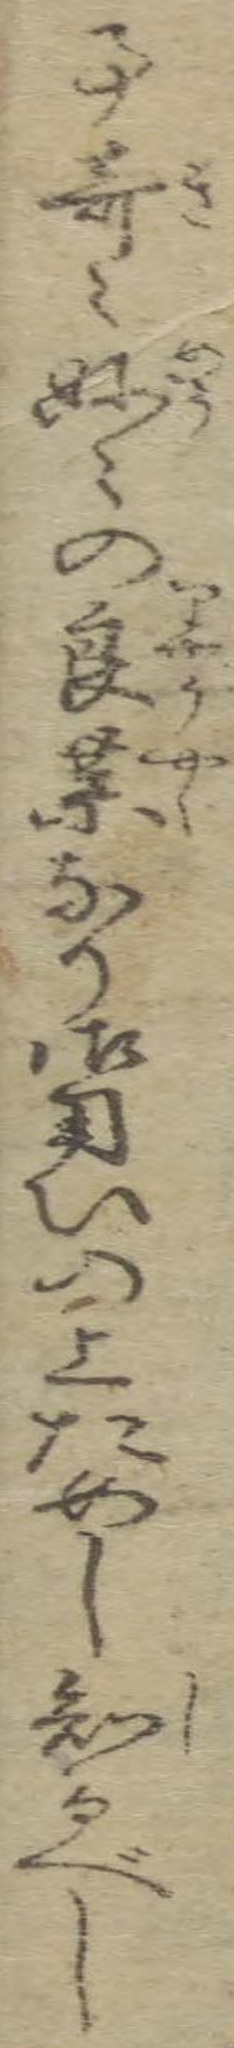事奇々妙々の良薬なり御用ひの上ためし知るべし
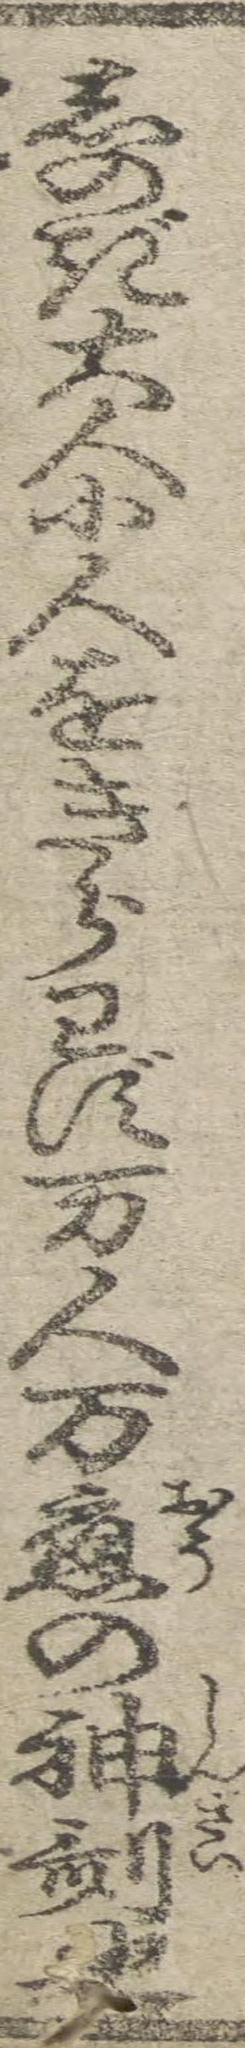しのぎ大人小人をきらわず万人万応の神劑也

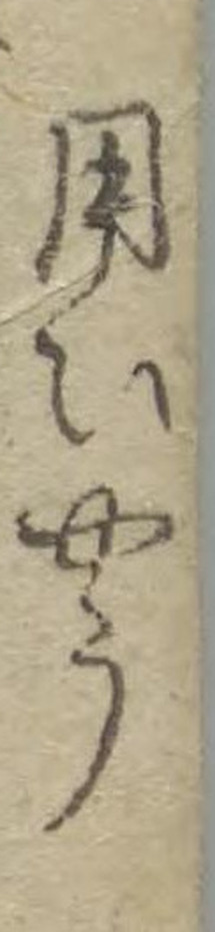用ひやう
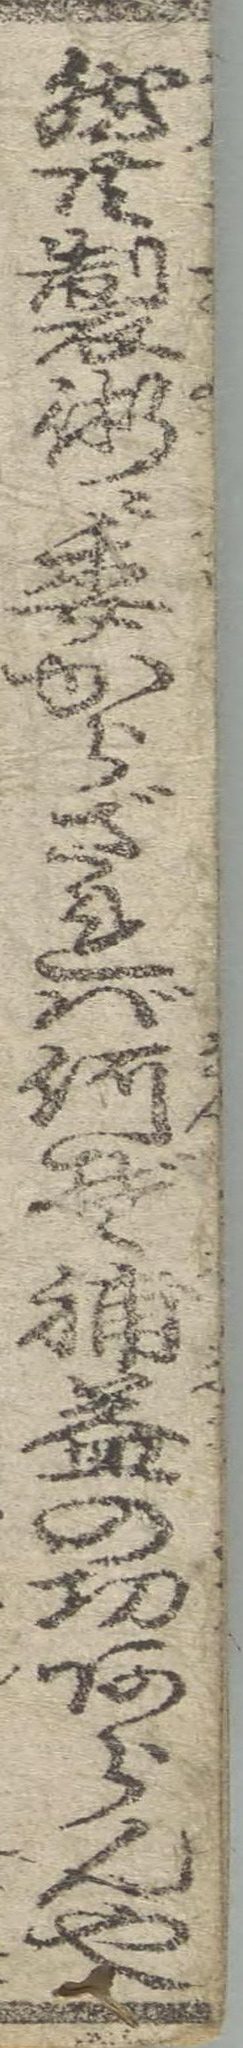然共製術委からざれば何ぞ補益の功あらんや
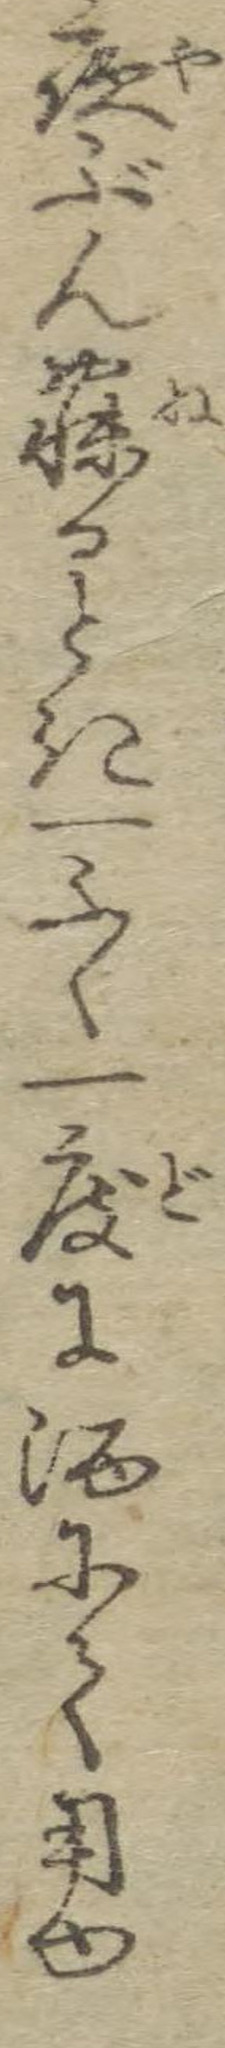一夜ぶん寝るとき一ふく一度に酒にて用ゆ
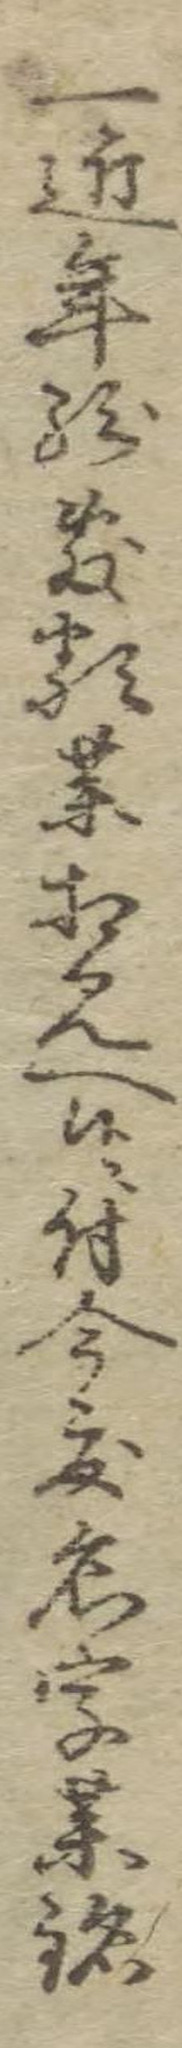一近年紛敷類薬相見へ候に付今度名字薬銘
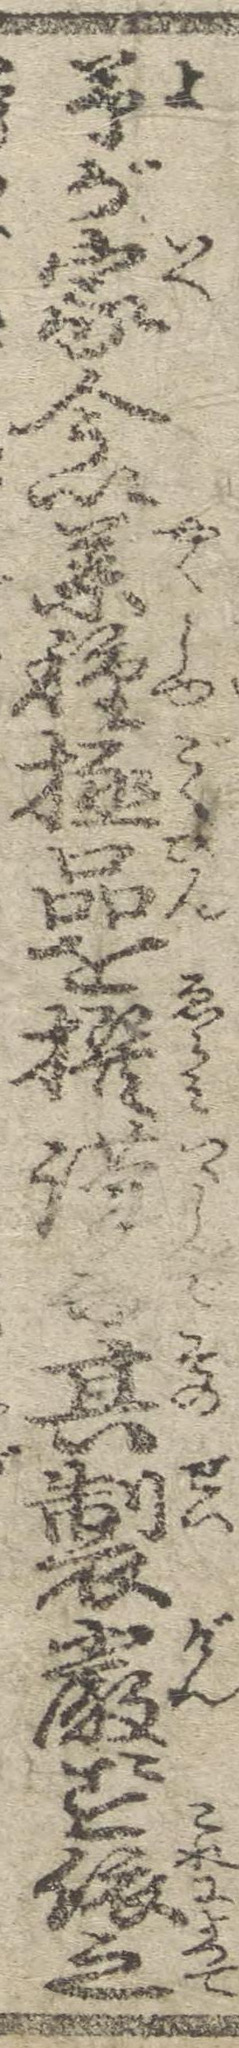予が家今以薬種極品を撰謹而其製厳依之
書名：浪華薬種問屋能書張交帖. 二
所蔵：国立国会図書館 National Diet Library, JAPAN
